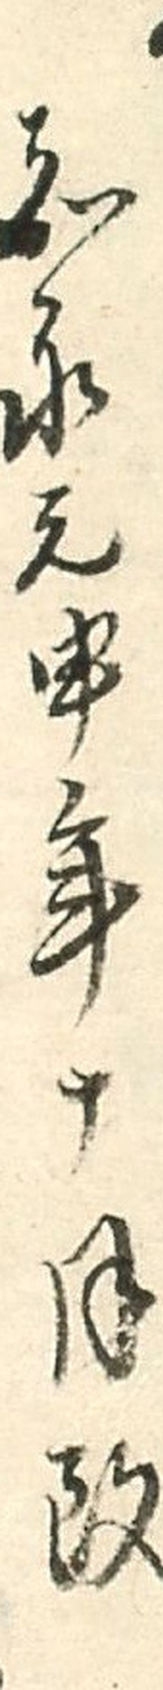嘉永元申年十月改
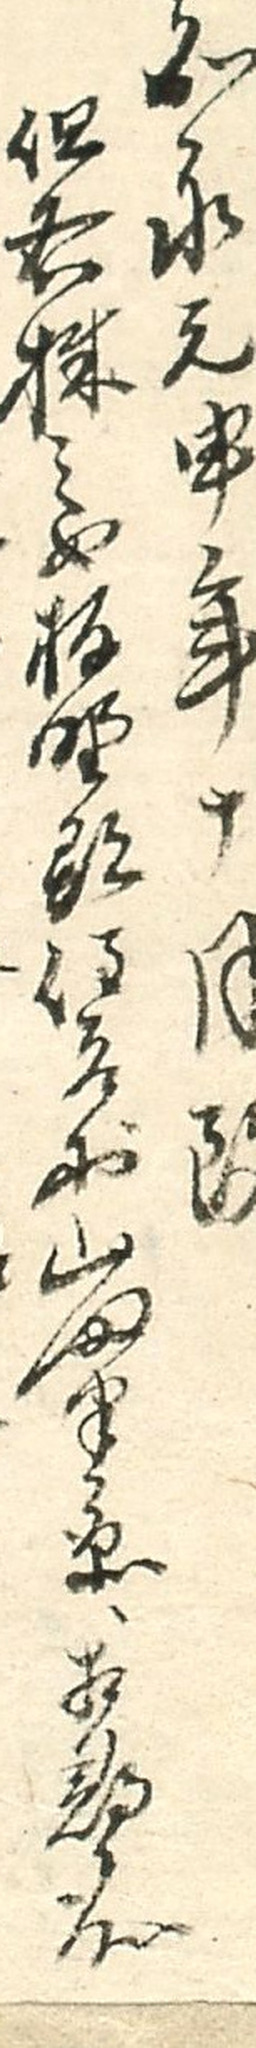但右株之義板野郡住吉村山田半兵衛へ相尋候所
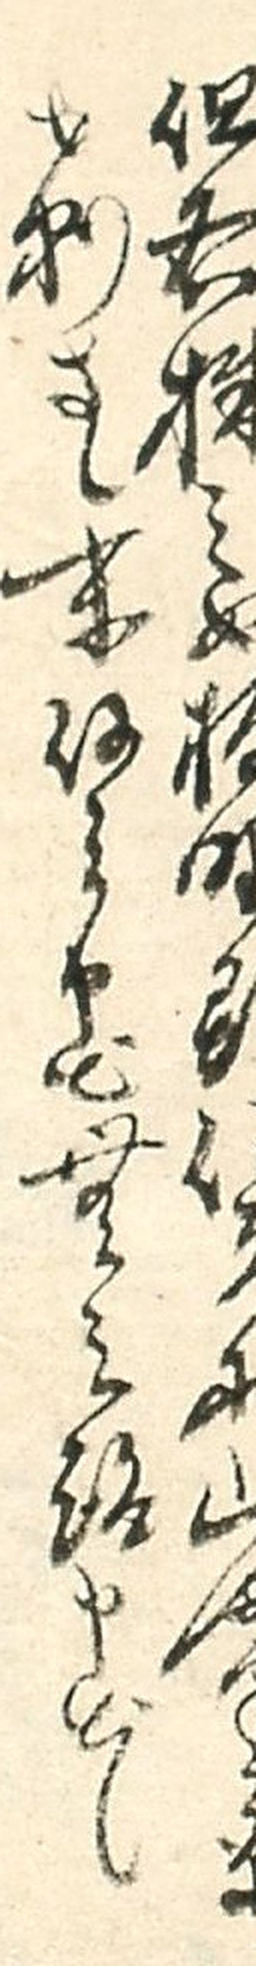才判方へ末何之申出無之趣申出候
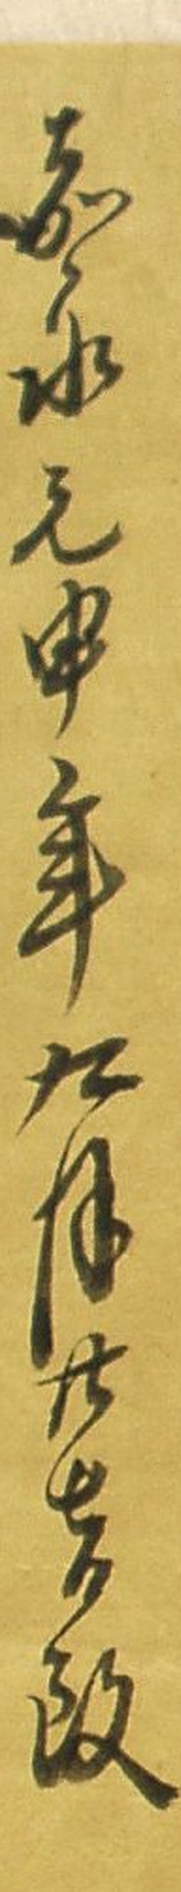嘉永元申年九月廿七日改
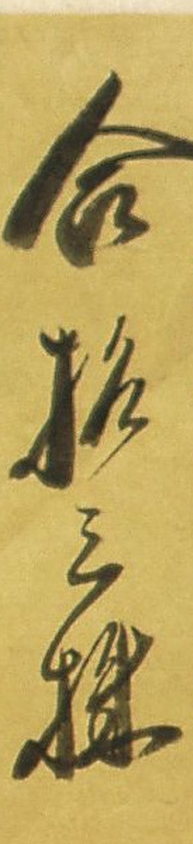合十三株

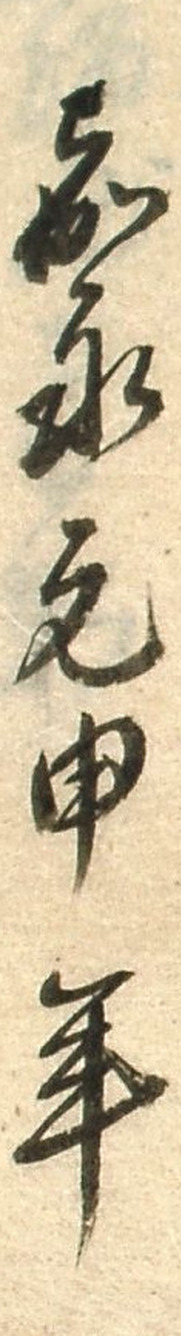嘉永元申年
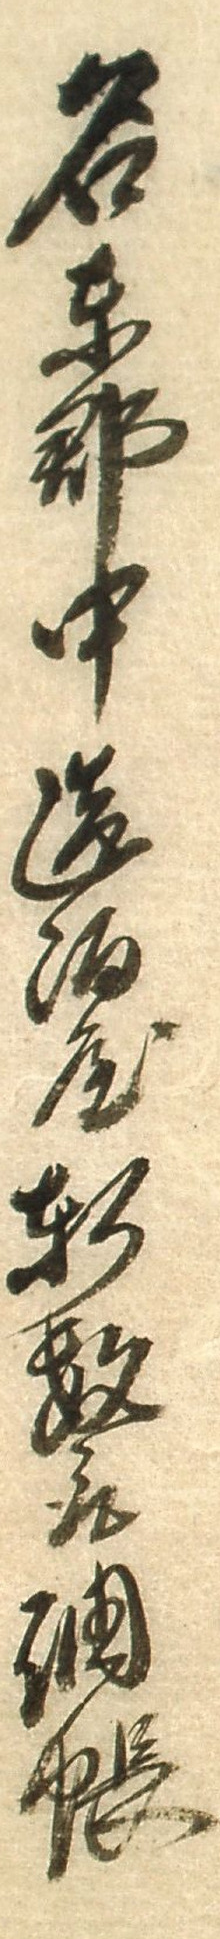名東郡中造酒屋軒数取調帳
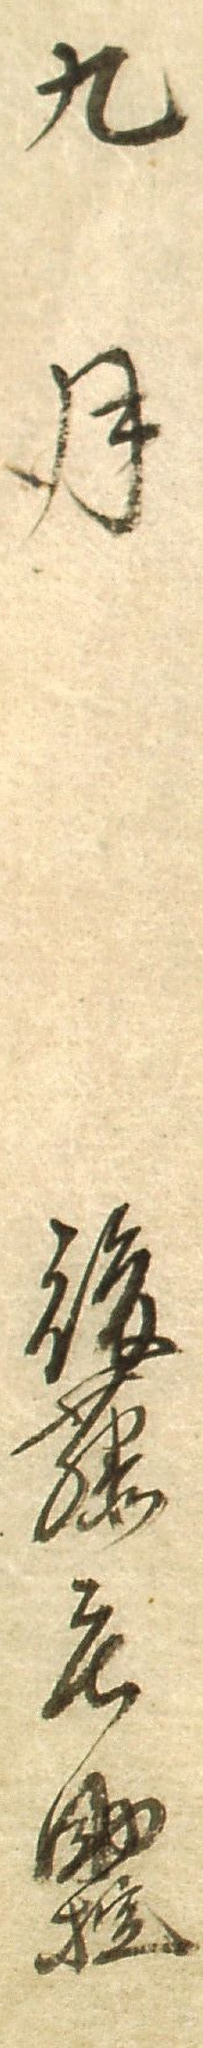九月後藤庄助控

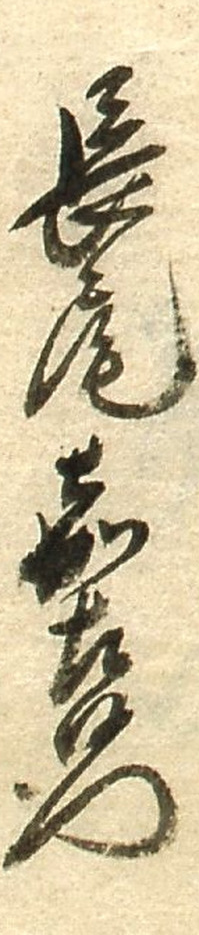長尾嘉左衛門
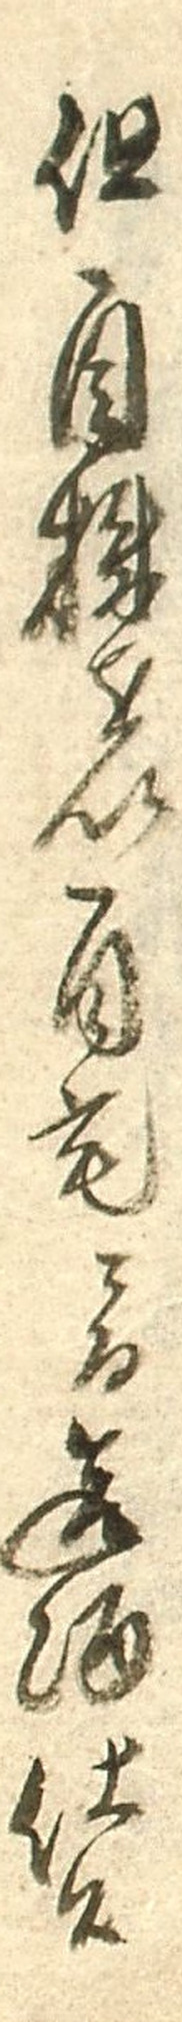但自株を以自宅にて造酒仕候

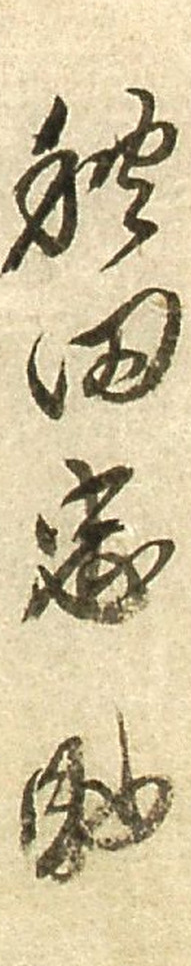秋田忠助
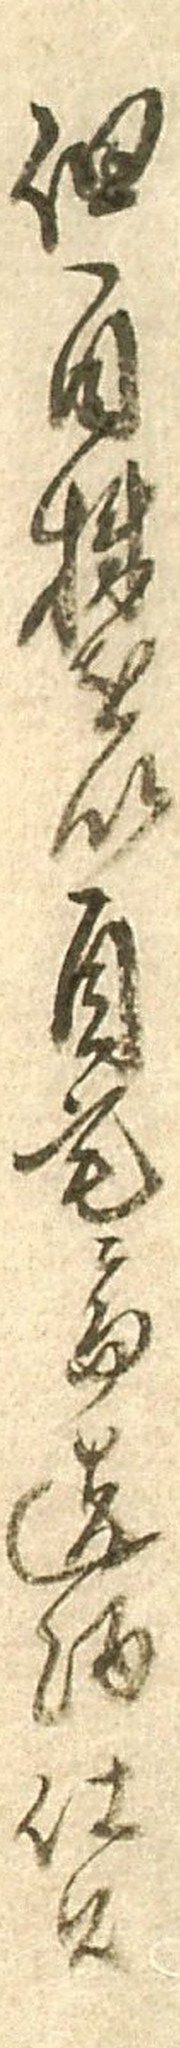但自株を以自宅にて造酒仕候
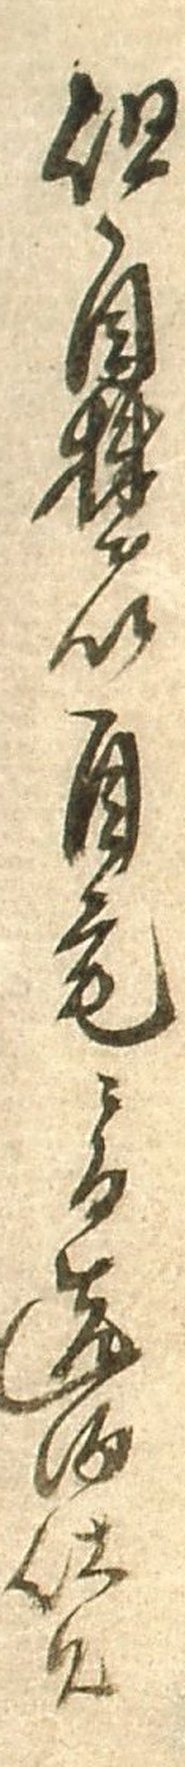但自株を以自宅にて造酒仕候

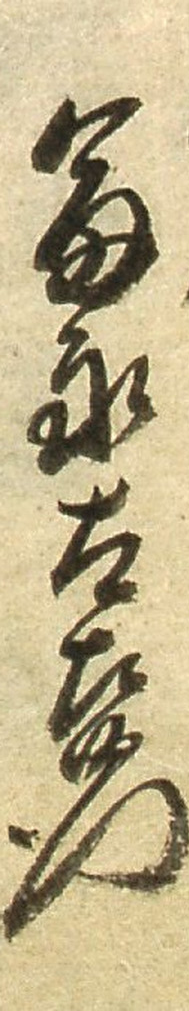富永太左衛門
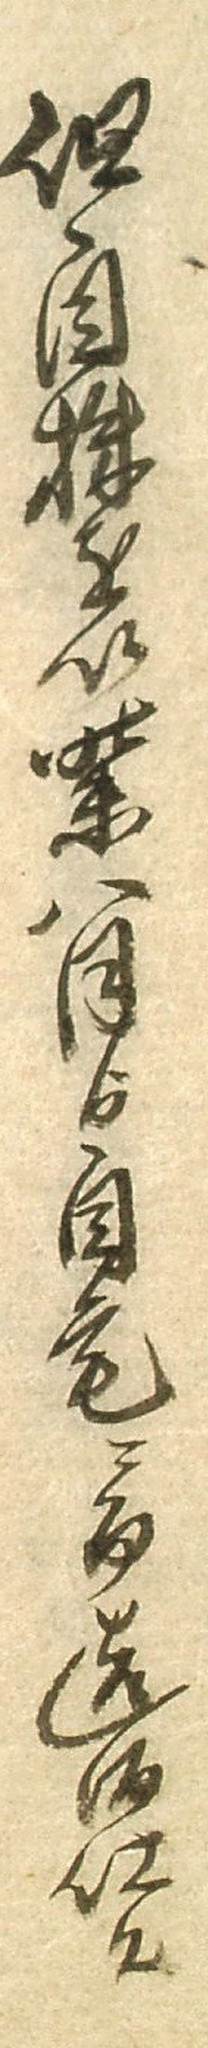但自株を以時未八月より自宅にて造酒仕候
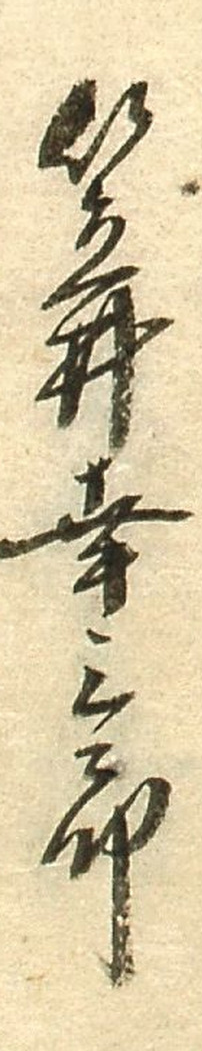笠井幸三郎
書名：名東郡中酒株並造酒屋軒数取調帳
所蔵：鳴門教育大学 Naruto University of Education
